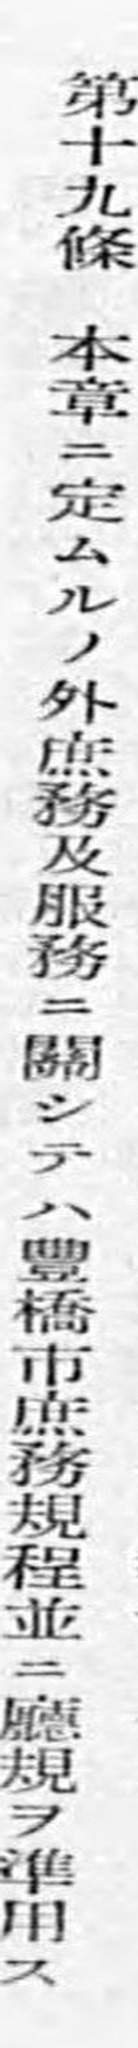第十九条本章ニ定ムルノ外庶務及服務ニ関シテハ豊橋市庶務規程並ニ庁規ヲ準用ス
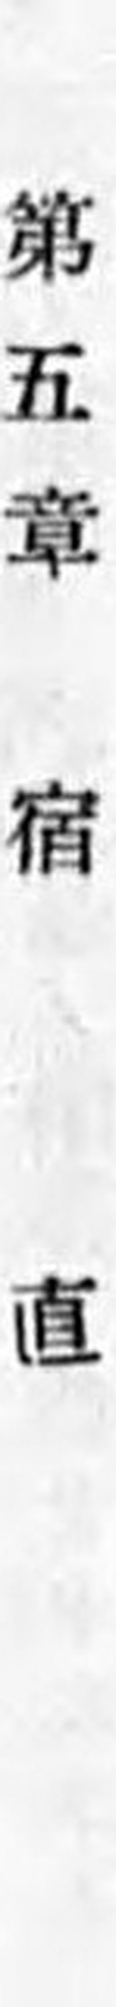第五章宿直
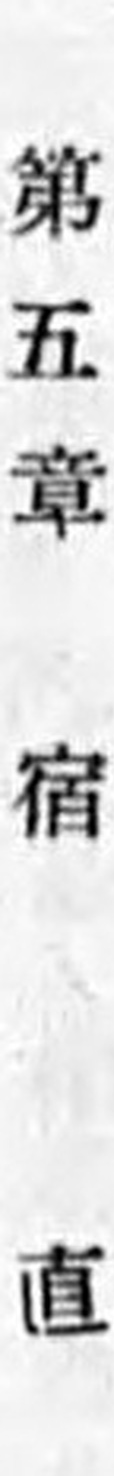第五章宿直
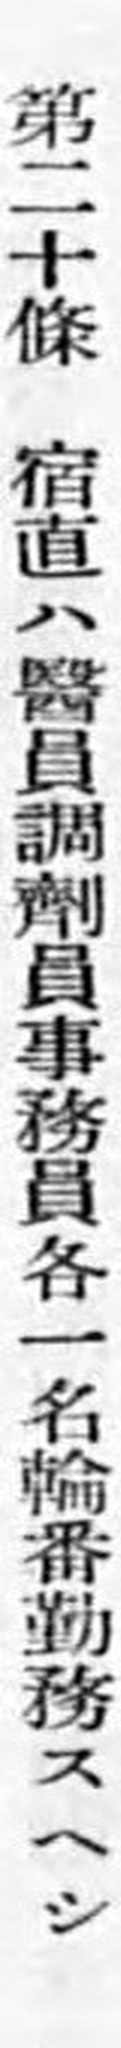第二十条宿直ハ医員調剤員事務員各一名輪番勤務スヘシ
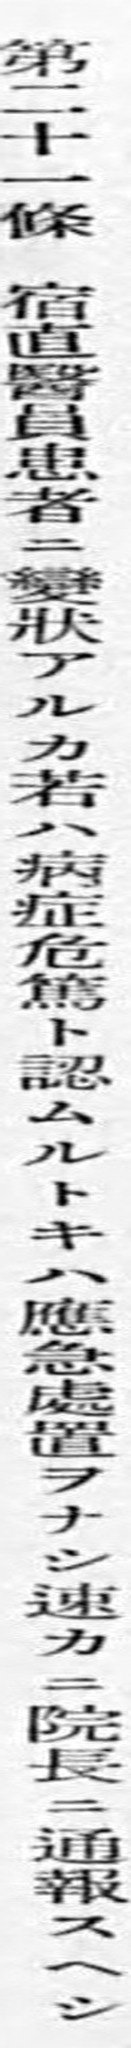第二十一条宿直医員患者ニ変状アルカ若ハ病症危篤ト認ムルトキハ応急処置ヲナシ速カニ院長ニ通報スヘシ
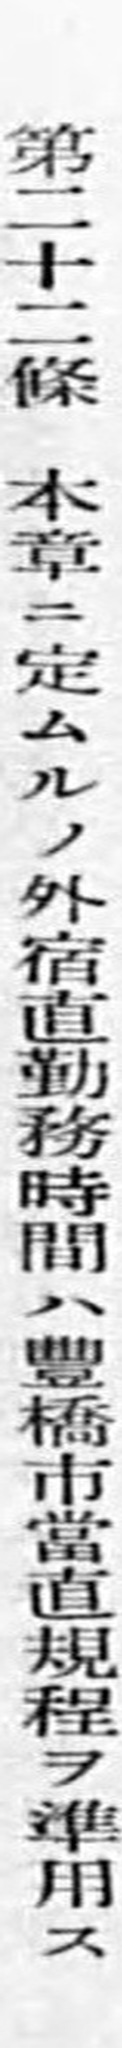第二十二条本章ニ定ムルノ外宿直勤務時間ハ豊橋市当直規程ヲ準用ス
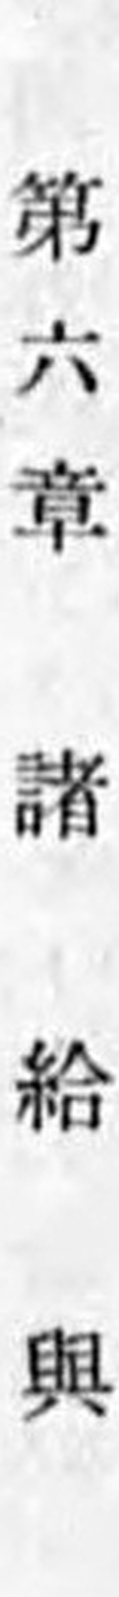第六章諸給与
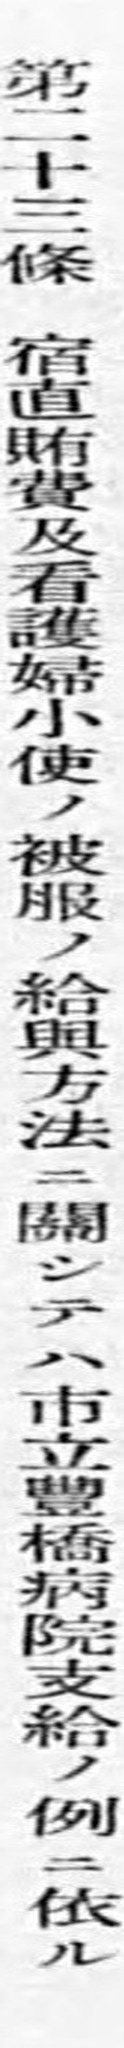第二十三条宿直賄費及看護婦小使ノ被服ノ給与方法ニ関シテハ市立豊橋病院支給ノ例ニ依ル
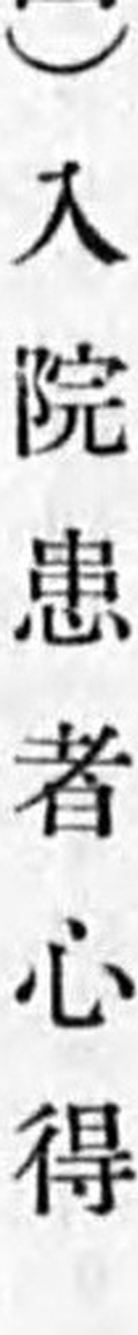(四)入院患者心得
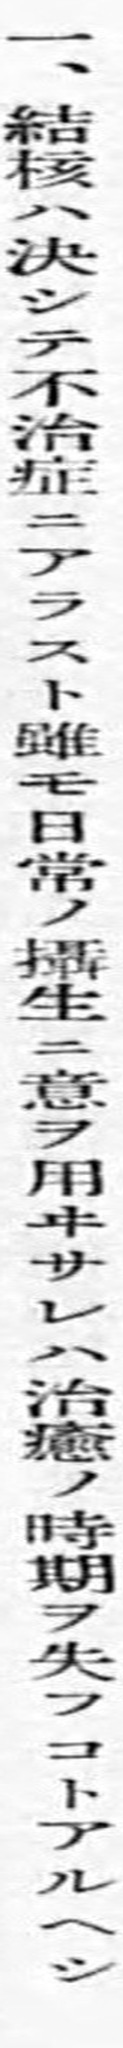一、結核ハ決シテ不治症ニアラスト雖モ日常ノ摂生ニ意ヲ用ヰサレハ治癒ノ時期ヲ失フコトアルヘシ
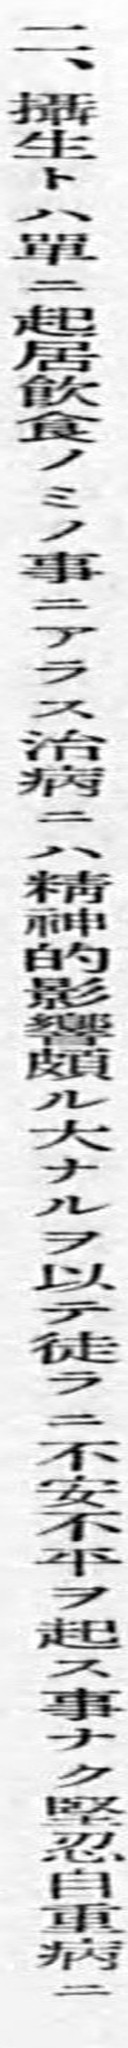二、摂生トハ単ニ起居飲食ノミノ事ニアラス治病ニハ精神的影響頗ル大ナルヲ以テ徒ラニ不安不平ヲ起ス事ナク堅忍自重病ニ
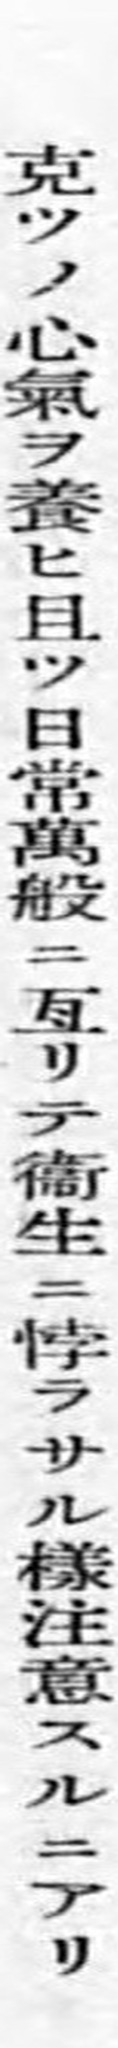克ツノ心気ヲ養ヒ且ツ日常万般ニ亘リテ衛生ニ悖ラサル様注意スルニアリ
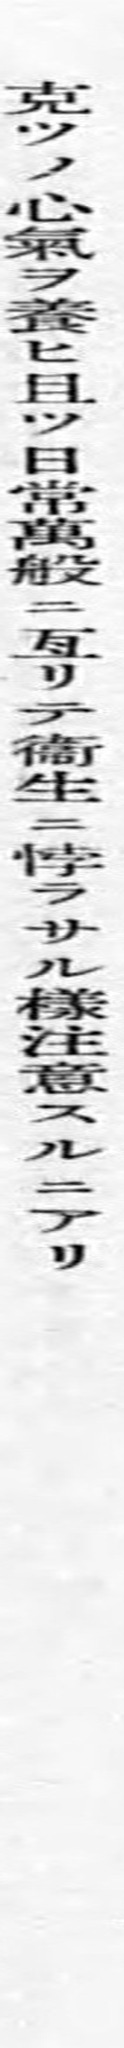克ツノ心気ヲ養ヒ且ツ日常万般ニ亘リテ衛生ニ悖ラサル様注意スルニアリ
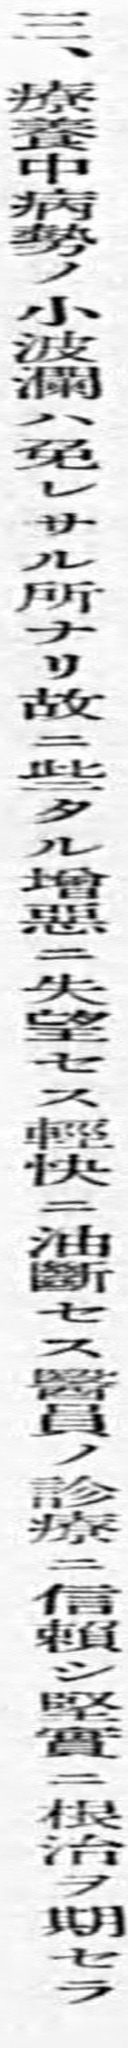三、療養中病勢ノ小波瀾ハ免レサル所ナリ故ニ些タル憎悪ニ失望セス軽快ニ油断セス医員ノ診療ニ信頼シ堅実ニ根治ヲ期セラ
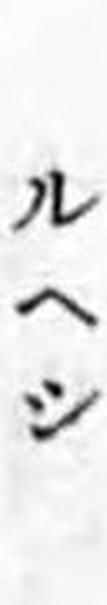ルヘシ
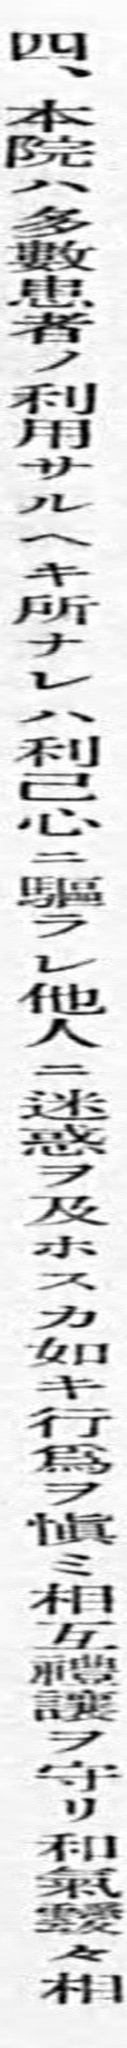四、本院ハ多数患者ノ利用サルヘキ所ナレハ利己心ニ駆ラレ他人ニ迷惑ヲ及ホスカ如キ行為ヲ慎ミ相互礼譲ヲ守リ和気靉々相
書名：豊橋市立高山病院年報. 昭和12年度
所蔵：国立国会図書館 National Diet Library, JAPAN
